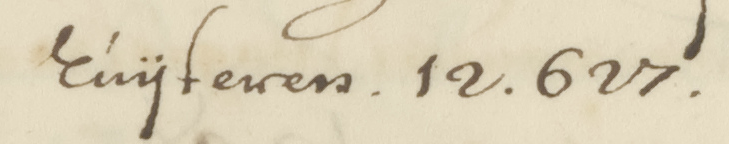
ruijteren, 12, 627.
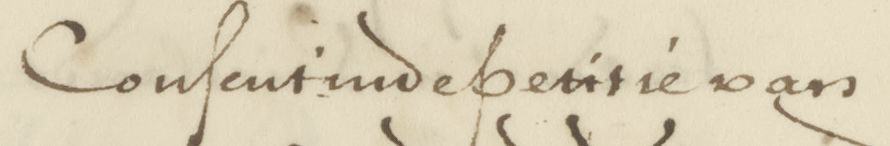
Consent inde petitie van
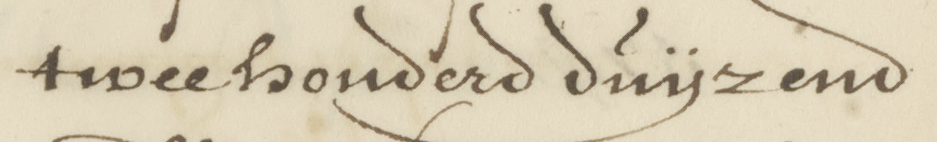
tweehonderd duijzend
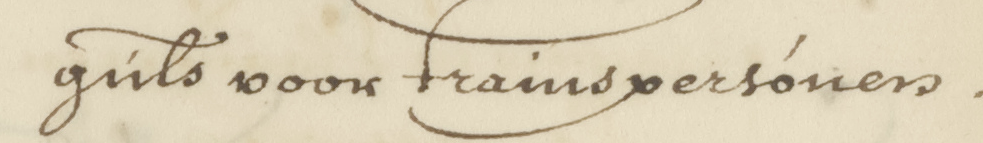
guls voor trainspersonen
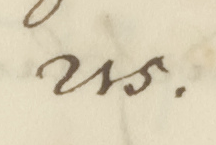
215.
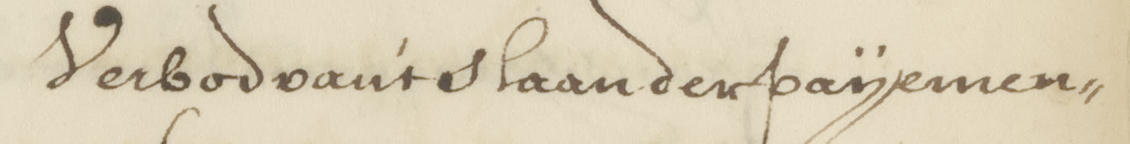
Verbod van't slaan der paijemen„
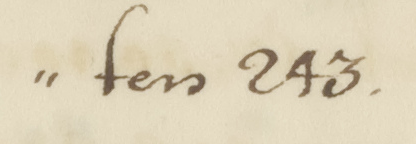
,,ten 243.
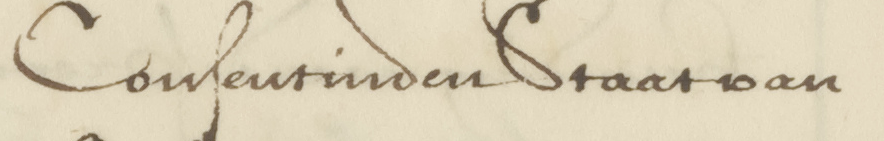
Consent inden Staat van
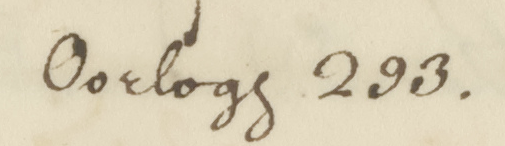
Oorlogh 293.
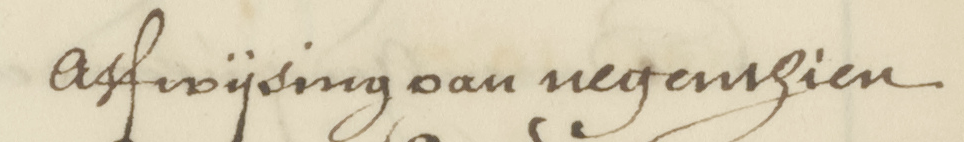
affwijsing van negenthien
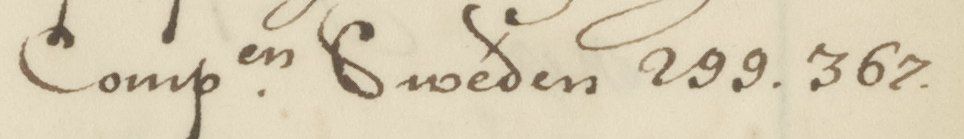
Compen. Sweden 299, 367,
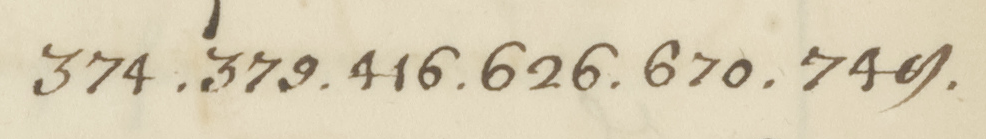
374, 379, 416, 626, 670, 748,
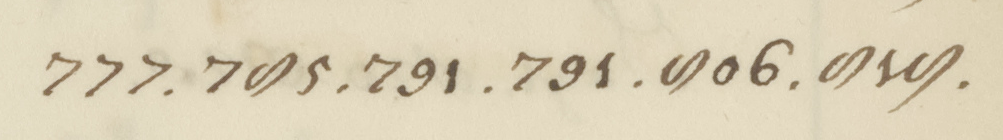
777, 785, 791,731, 806, 818,
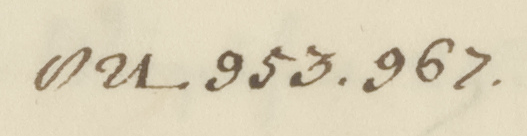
821, 953, 967.
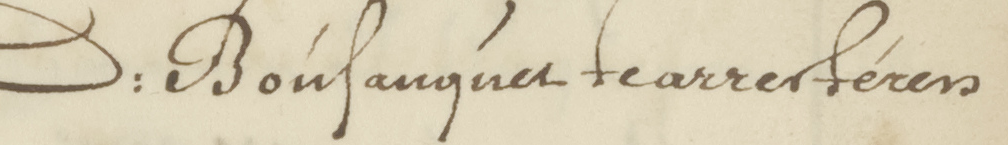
D: Bousanquet te arresteren
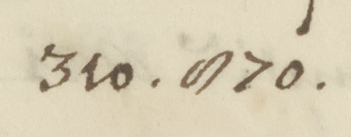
310, 870.
